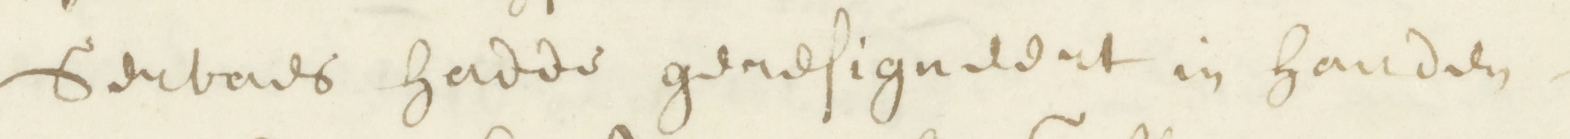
Servaes hadde geresigneert in handen
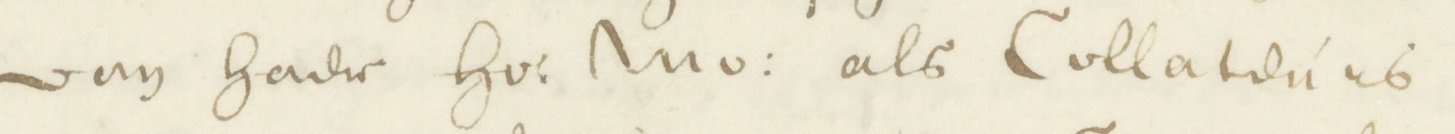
van haer ho:Mo: als Collateurs
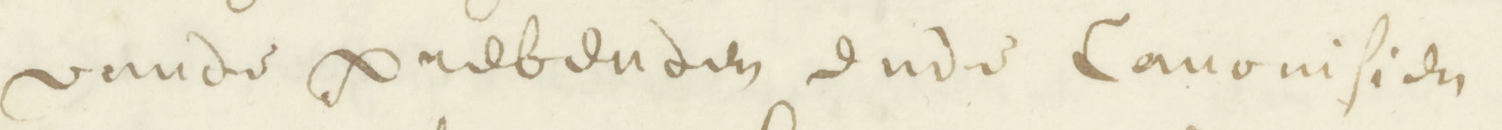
vande prebenden ende Canonisien
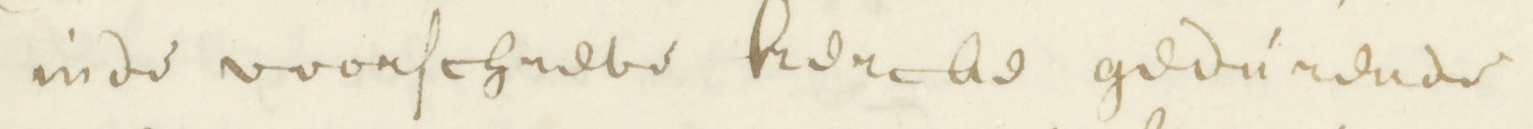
inde voorschreve kercke gedurende
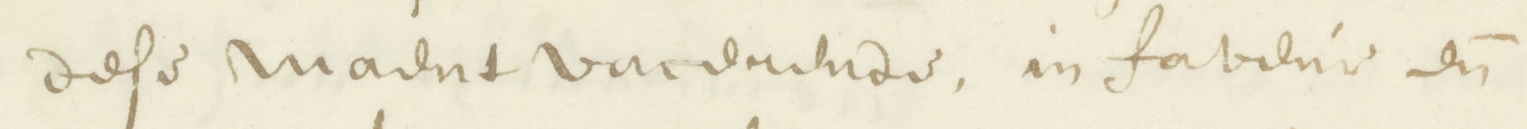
dese maent vacerende, in faveur en
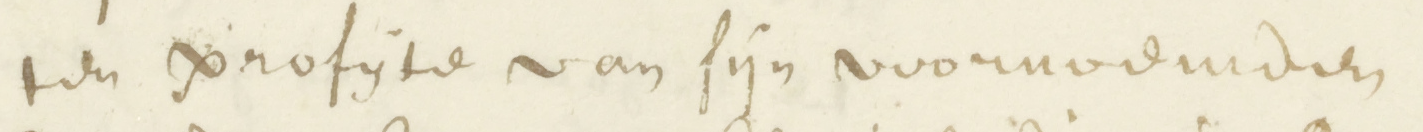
ten profijte van sijn voornoemden
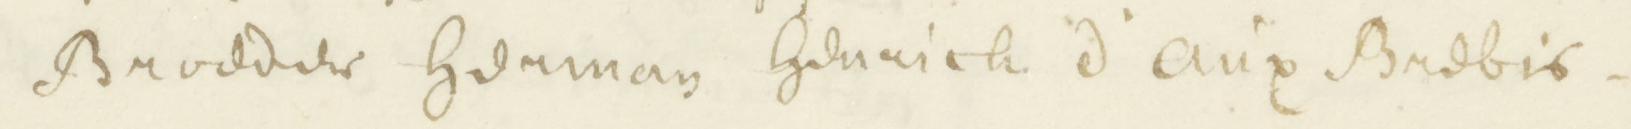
Broeder herman henrick d'aux Brebis
